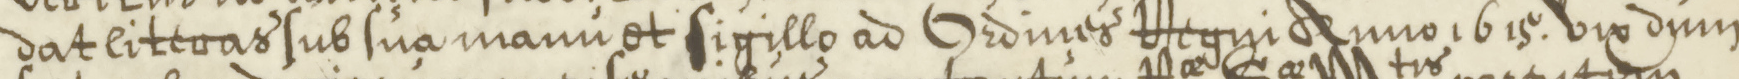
dat literas sub sua manu et sigillo ad Ordines Regni Anno 1615. Vix dum
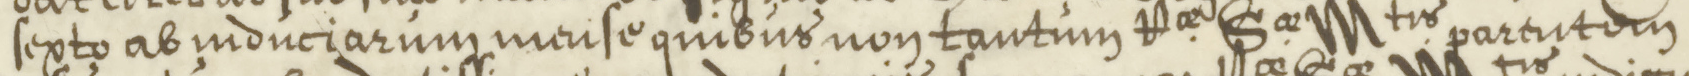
sexto ab induciarum mense quibus non tantum Ræ. Sæ Mtis. parentem
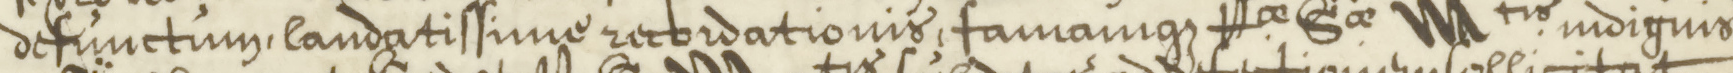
defunctum, laudatissime recordationis, famamque Ræ. Sæ Mtis. indignis
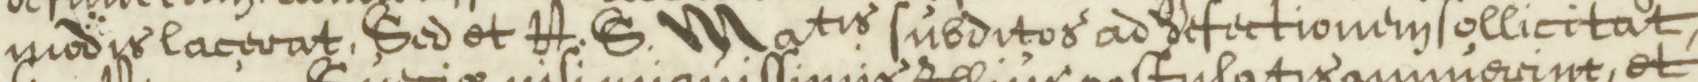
modis lacerat, Sed et R. S. Matis. subditos ad defectionem sollicitat,
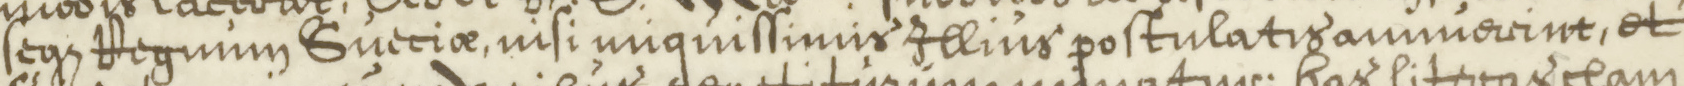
seque Regnum Sueciæ, nisi iniquissimis Illius postulatis annuerint, et
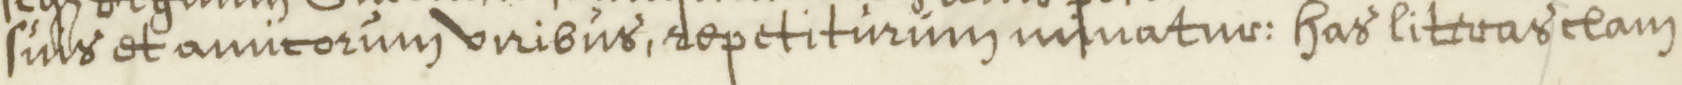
suis et amicorum viribus, repetiturum minatur: has literas clam
